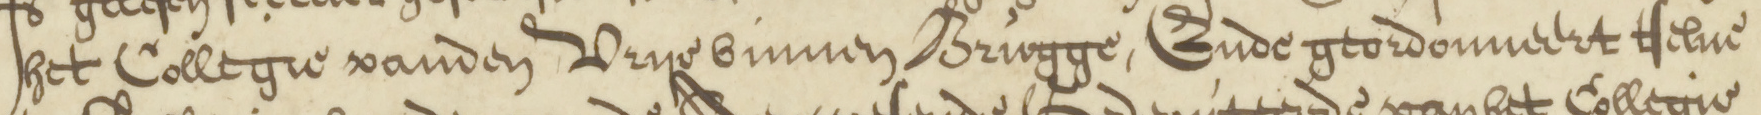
het Collegie vanden Vrye binnen Brugge. Ende geordonneert tselue
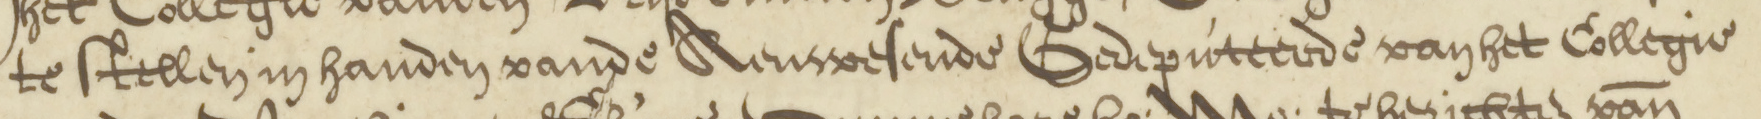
te stellen in handen vande Aenwesende Gedeputeerde van het Collegie
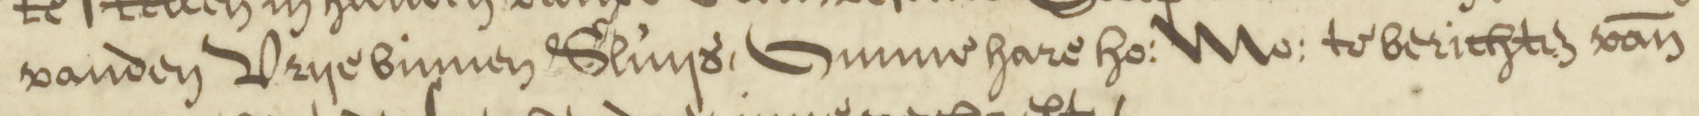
vanden Vrye binnen Sluys, Omme hare ho:Mo: te berichten van
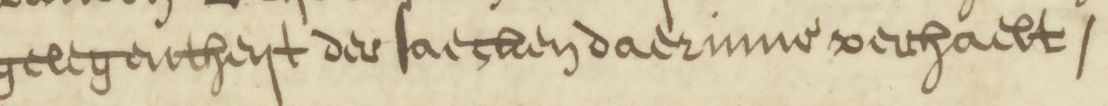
gelegentheyt der saecken daerinne verhaelt.
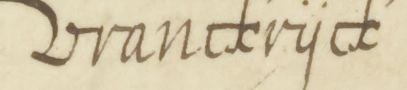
vranckrijck
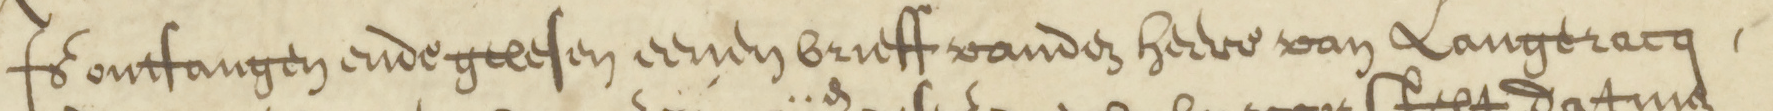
Is ontfangen ende gelesen eenen brieff vanden heere van Langeracq,
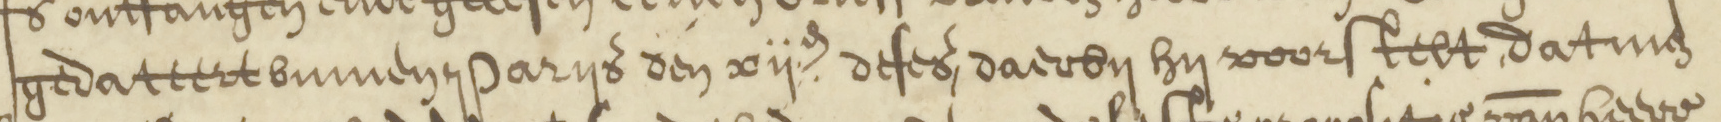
gedateert binnen Parys den vijen. deses, daerby hy voorstelt datmen
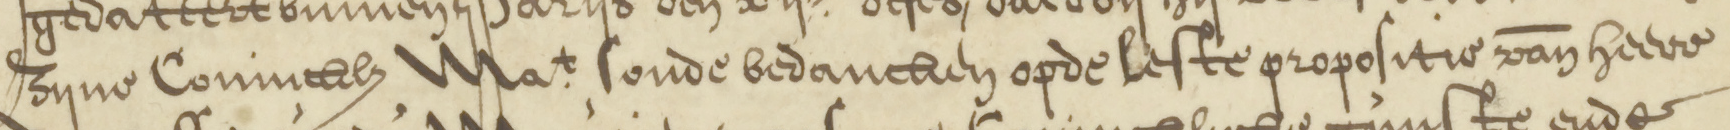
Zyne Coninckl Mat. soude bedancken opde leste propositie van heere
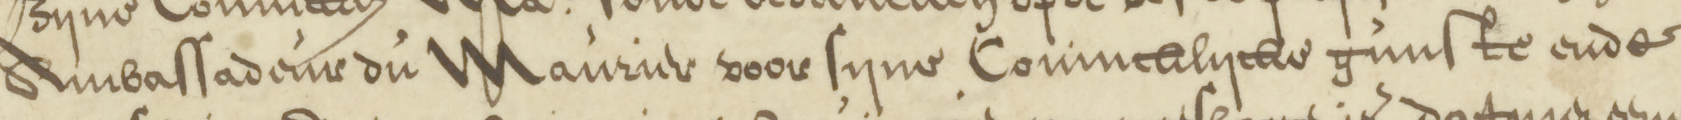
Ambassadeur du Maurier voor syne Conincklycke gunste ende
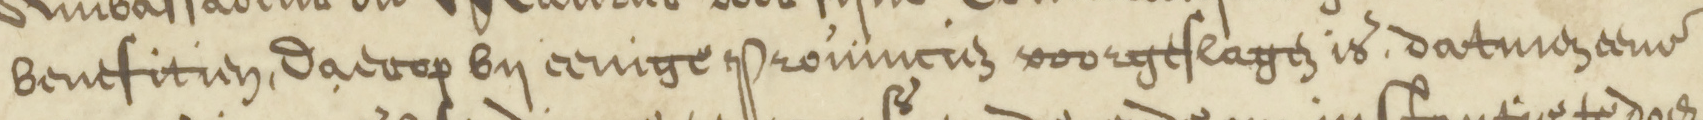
benefitien, daerop by eenige Prouincien voorgeslagen is, datmen eene
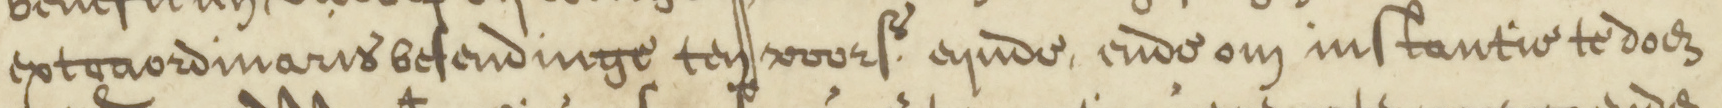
extraordinaris besendinge ten voors. eynde, ende om instantie te doen
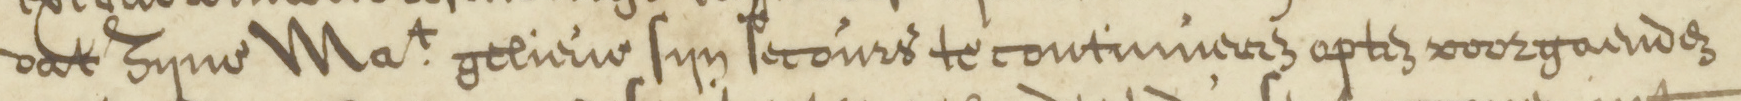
dat Zyne Mat. gelieue syn secours te continueren opten voorgaenden
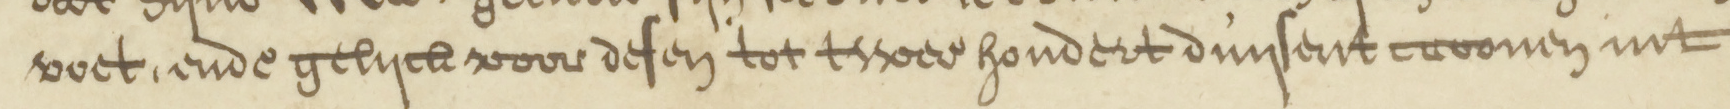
voet, ende gelyck voor desen tot twee hondert duysent croonen int
